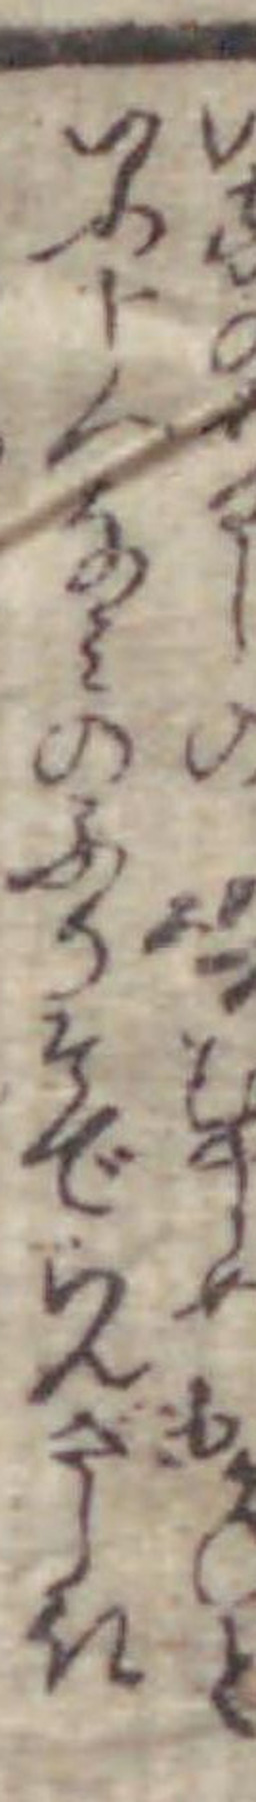いふ十人なみのふりそでちんざしき
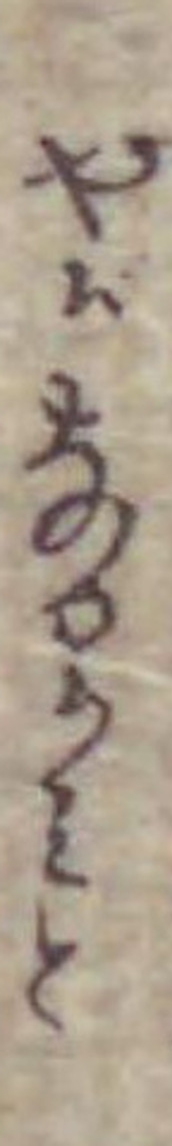やばなるかみと
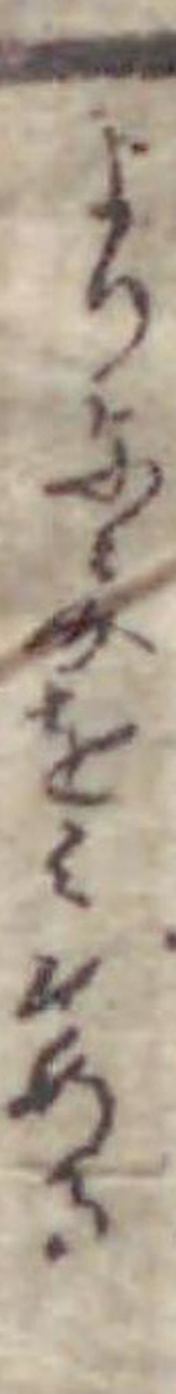より与之介をみそめる
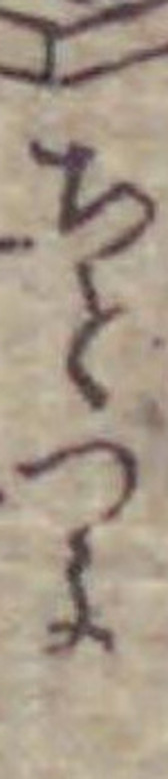ちとつよ
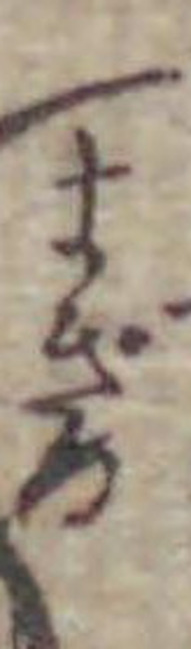すぎる
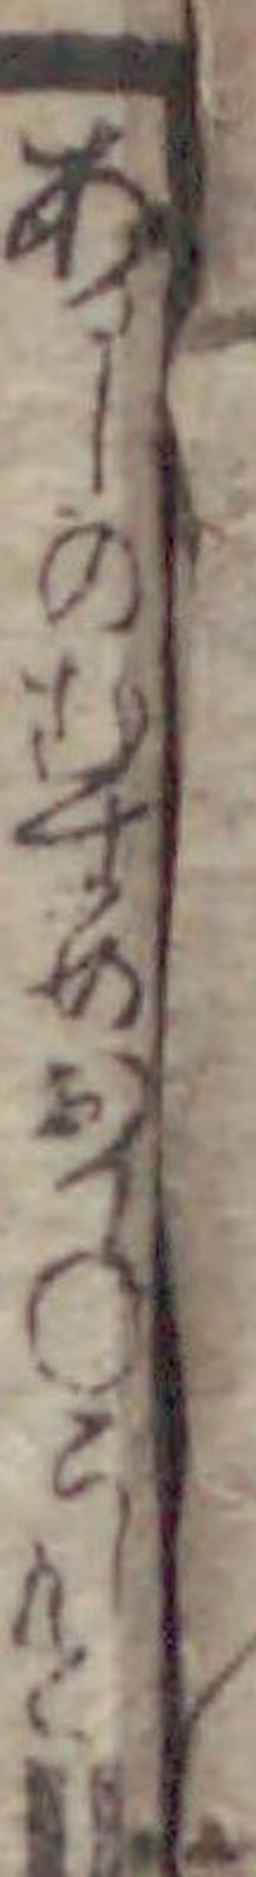あるしのむすめおかねこしもと
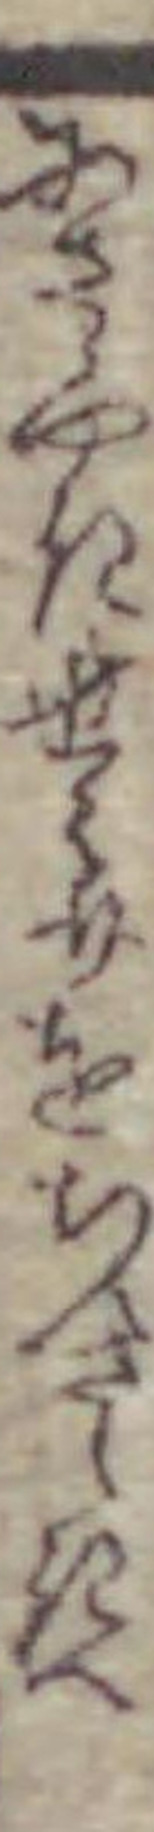にさゝやき世之介をちんさしきへ
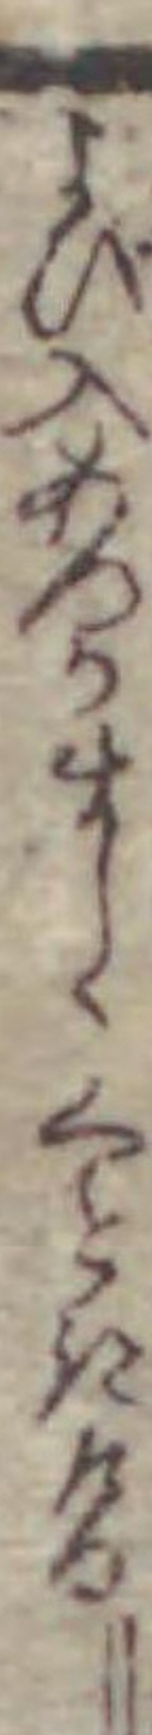よび入あつかましくくときける
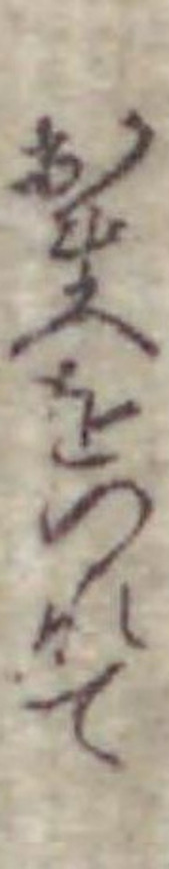おまへをつれて
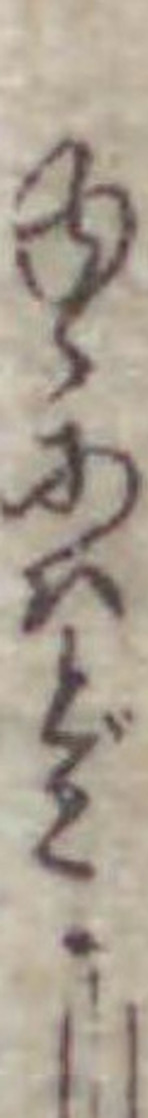ゆくにはどこ
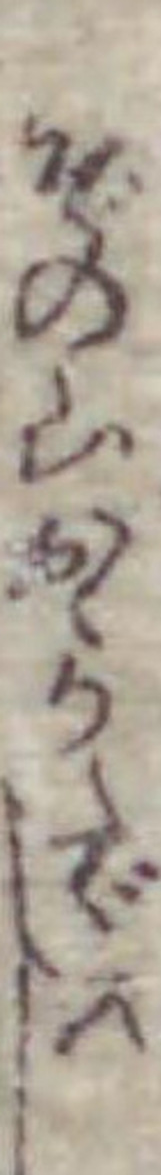ぞの山おくかたゞしは
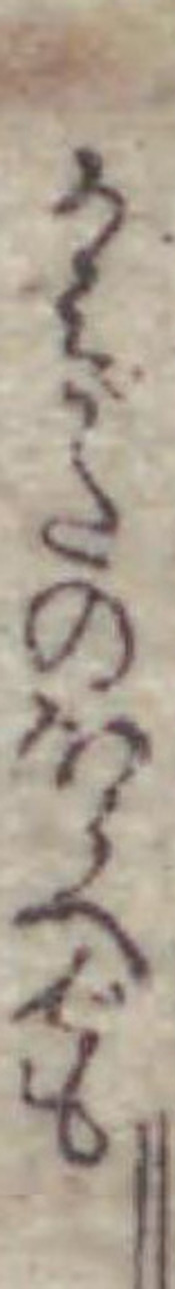かみがたのほうへでも
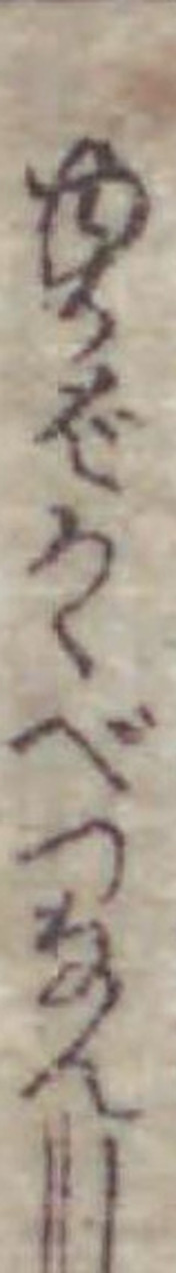ゆかばかくべつなん
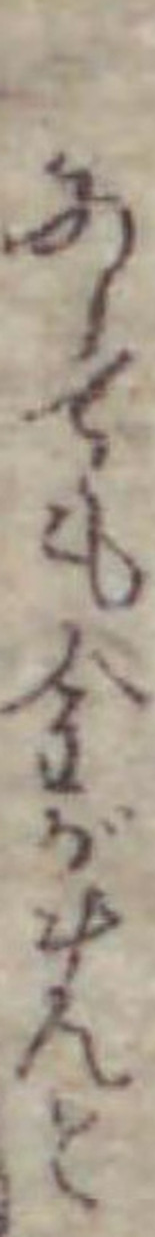にしても金がまんと
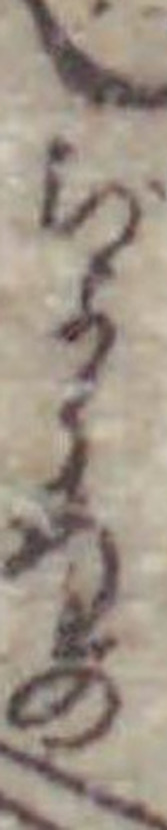ぢよう様の
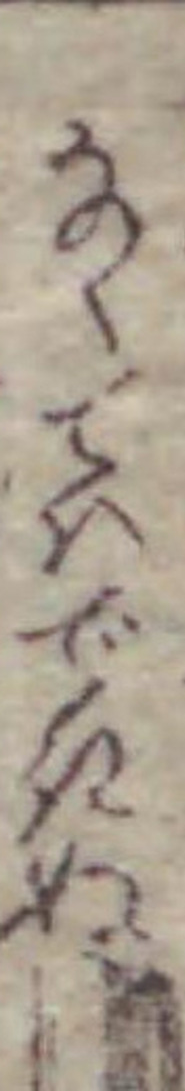なくてはできぬ
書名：嗚呼不侭世之助噺 : 3巻
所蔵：国立国会図書館 National Diet Library, JAPAN
